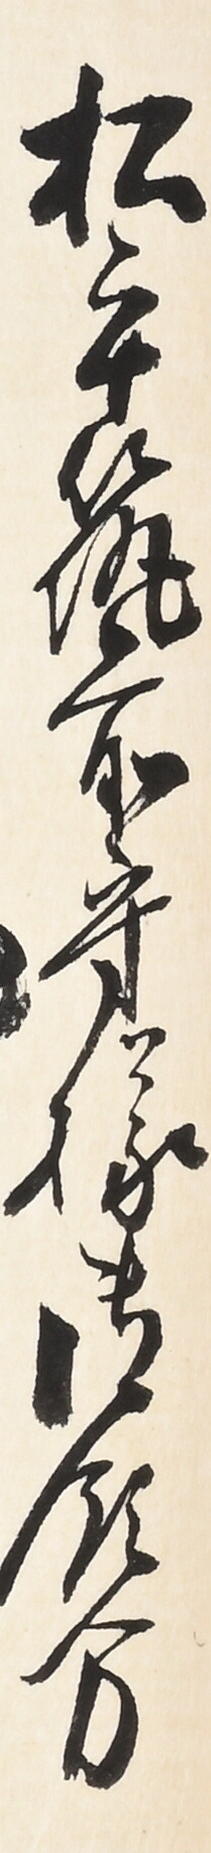松平筑前守様御領分
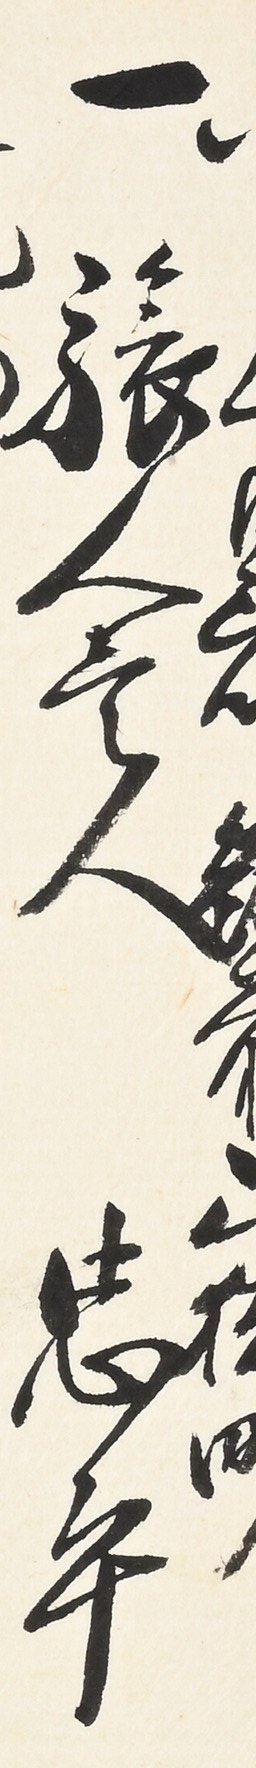一旅人壱人忠平
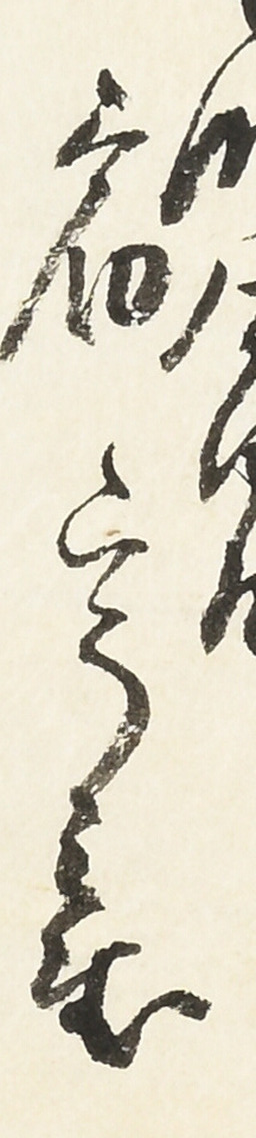宿宇兵衛
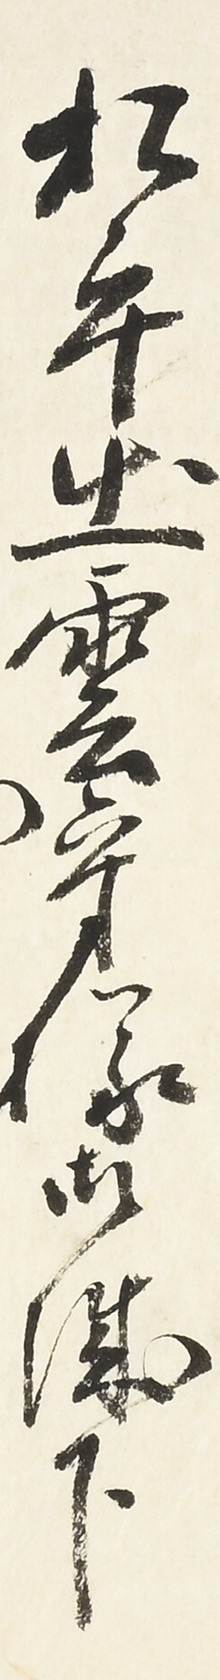松平出雲守様御城下
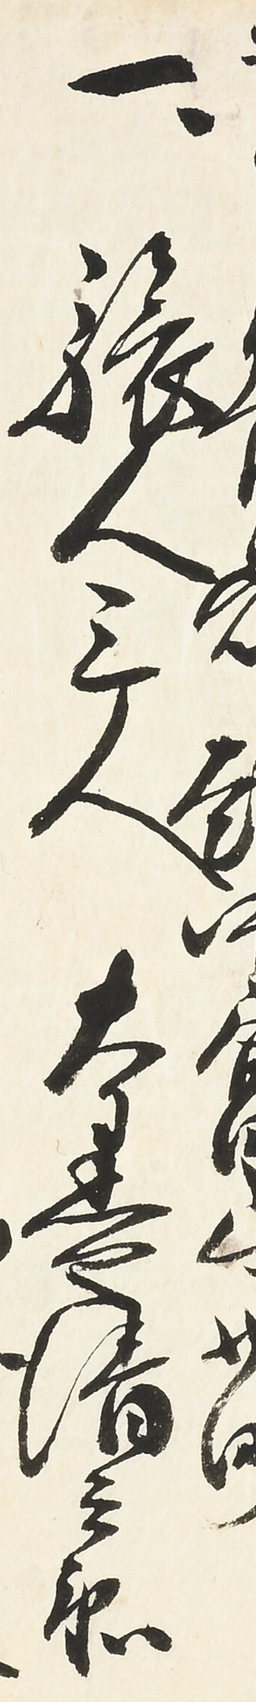一旅人三人大黒や清兵衛
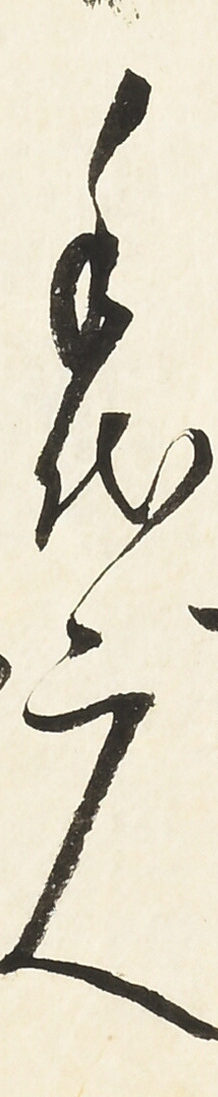手代二人
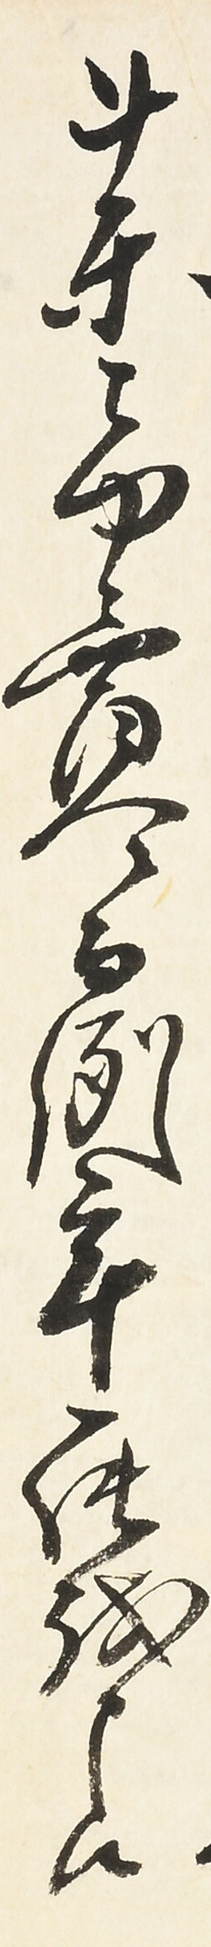唐津商売ニ而例年罷越申候
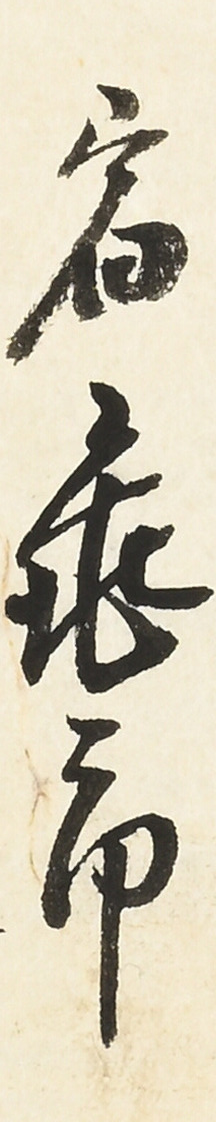宿亀市
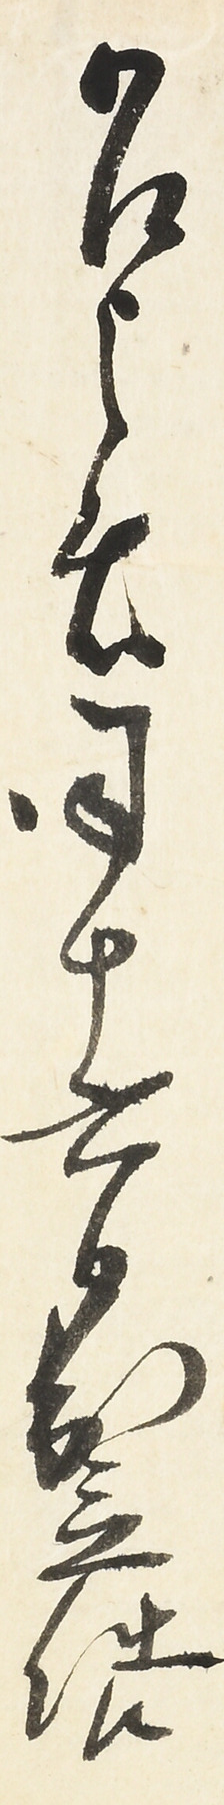右之者同十六日出立仕候
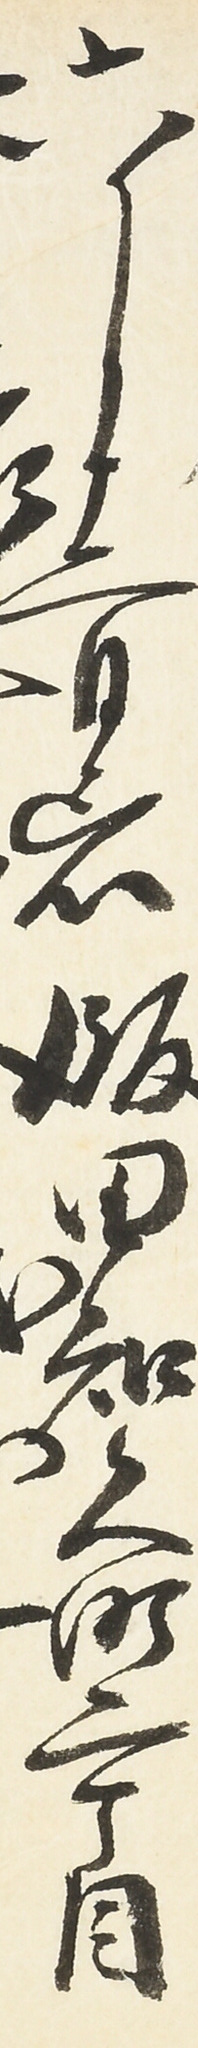六月十二日着飯田知久町二丁目
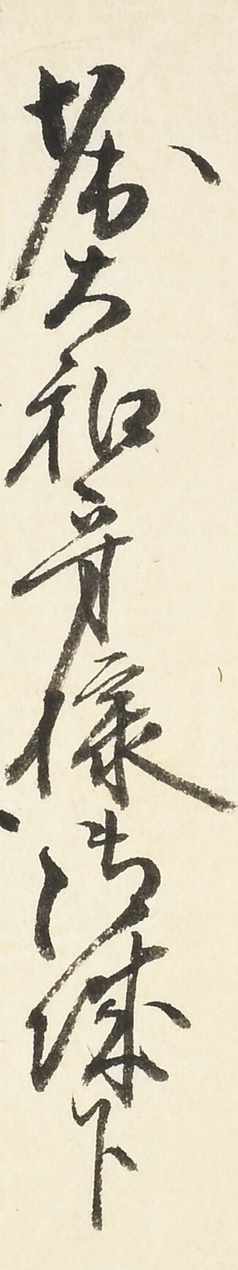堀大和守様御城下
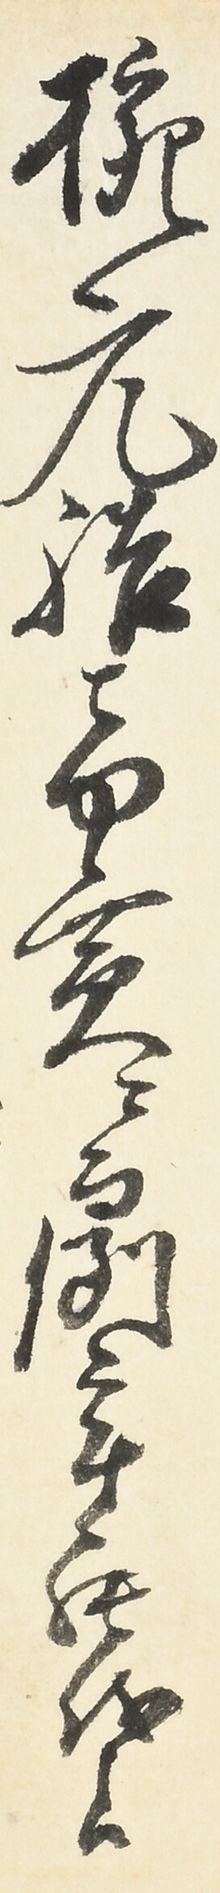椀元結商売ニ而例年罷越申候
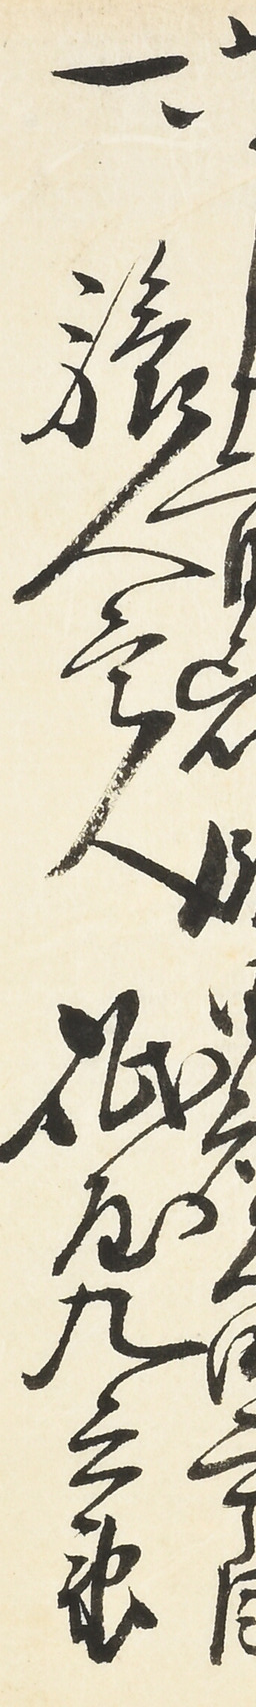一旅人壱人紙屋九兵衛
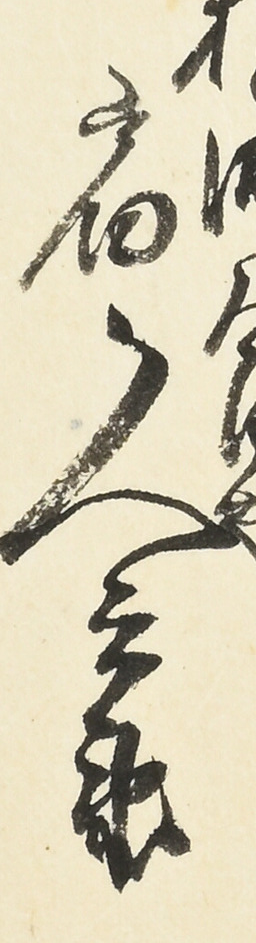宿久兵衛
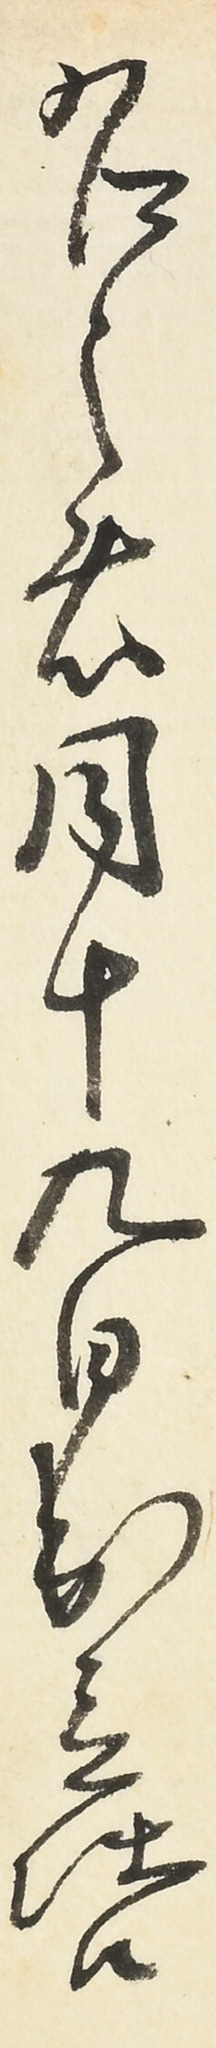右之者同十九日出立仕候

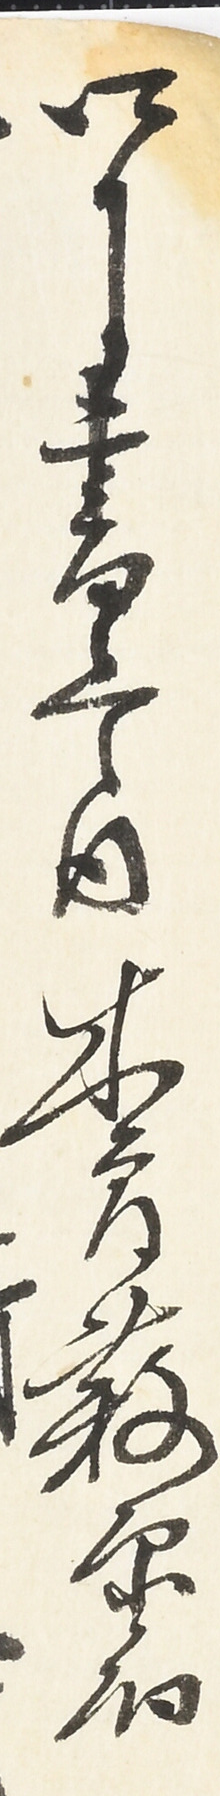四月書上之内木曽藪原宿
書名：町中旅人泊控帳
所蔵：伊那市立高遠町図書館・合同会社AMANE
